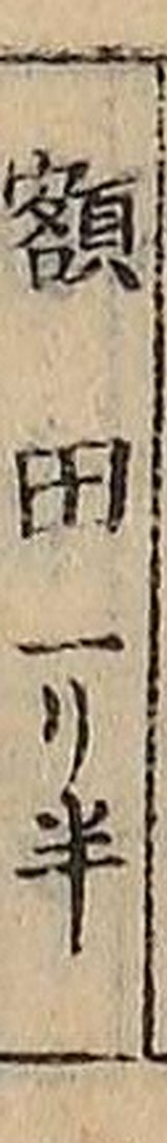額田一リ半
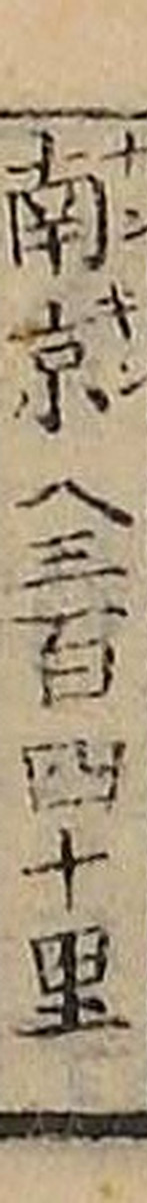南京へ三百四十里
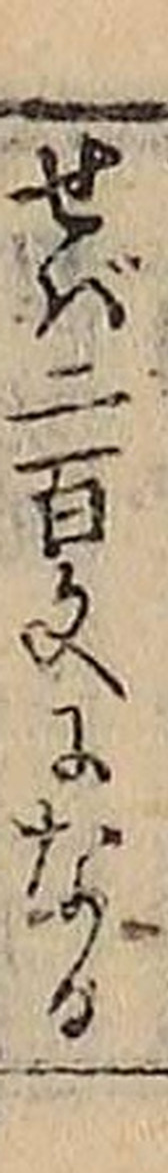せば二百文になる
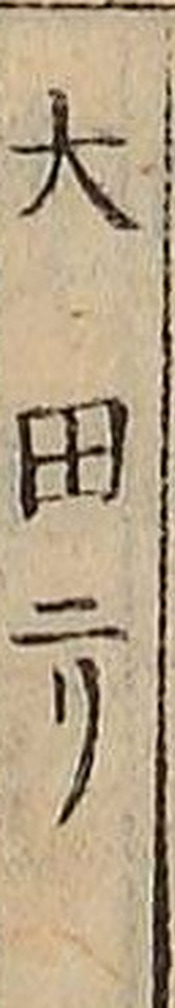大田二リ
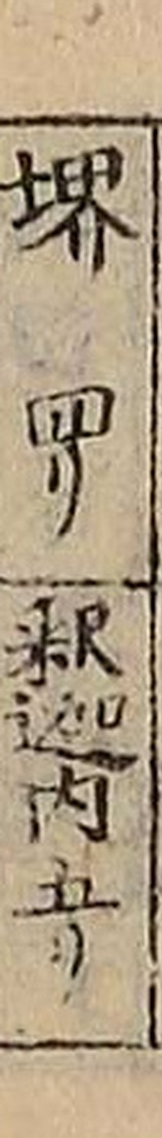堺四リ釈迦内五リ
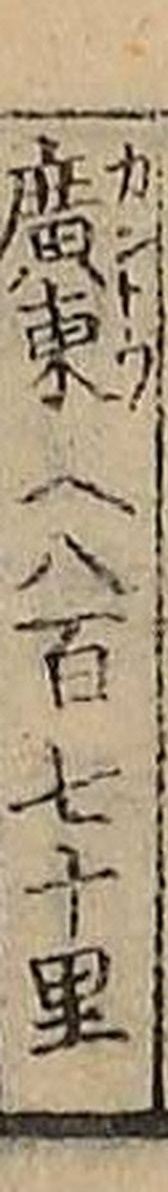広東へ八百七十里
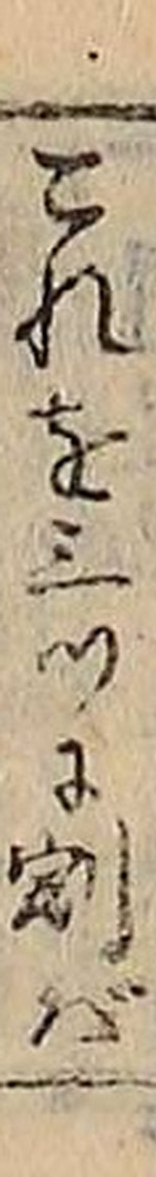これを三つに割ば
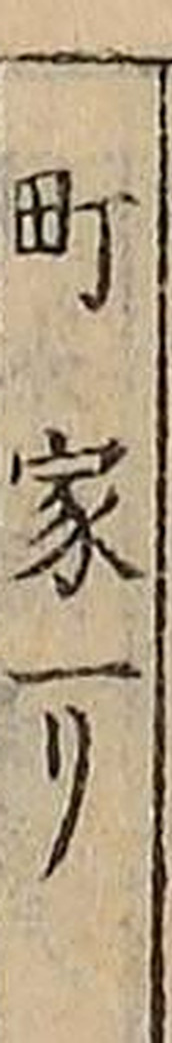町家一リ
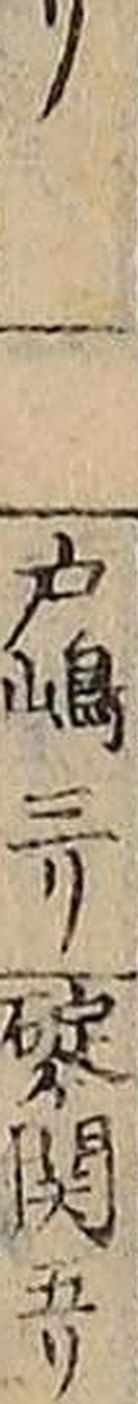戸島三リ碇ケ関五
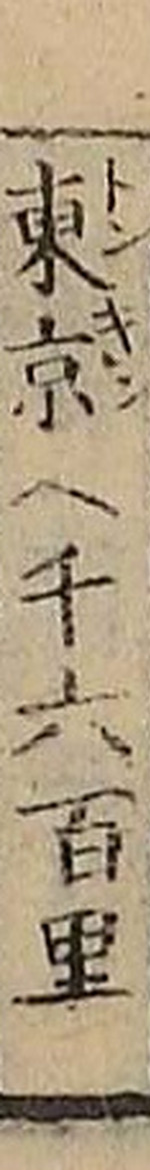東京へ千六百里
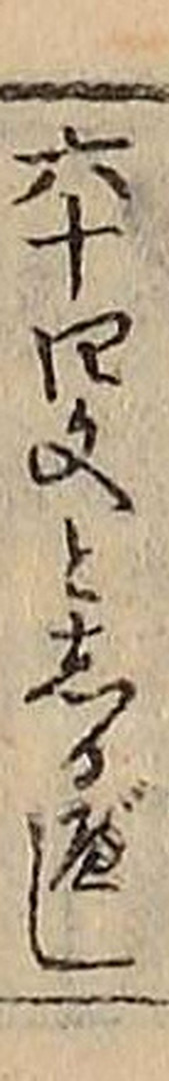六十四文としるべし
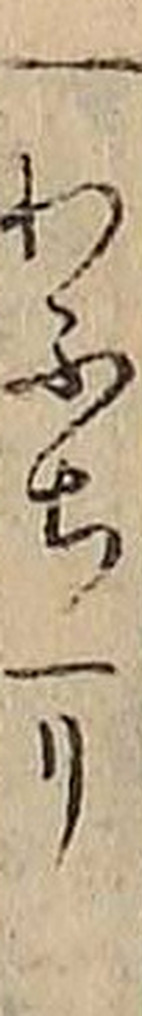わふち一リ
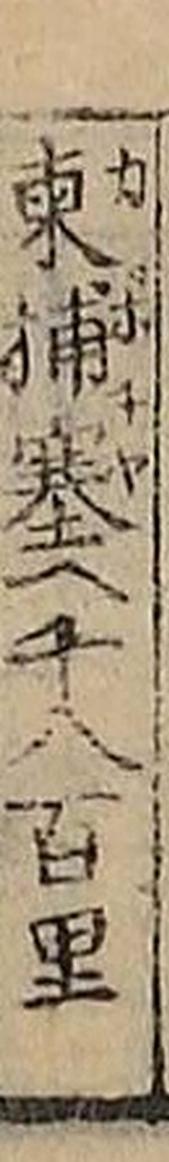柬捕塞へ千八百里
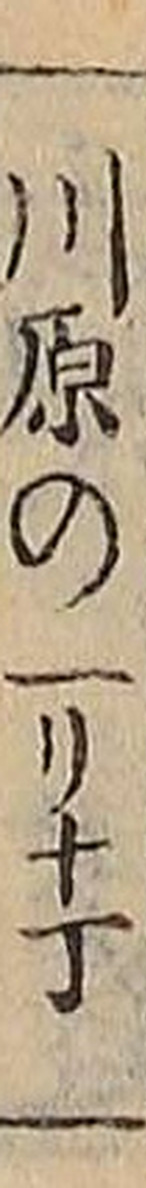川原の一リ十丁
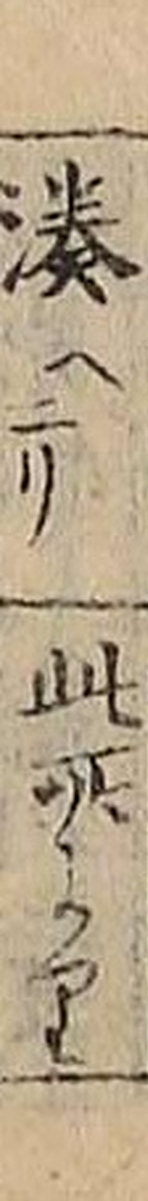湊ヘ二リ此所より
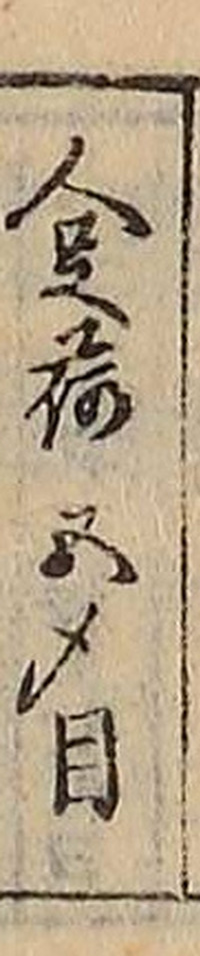人足荷五貫目
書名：旅行用心集
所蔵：神戸大学附属図書館 国文学研究資料館
